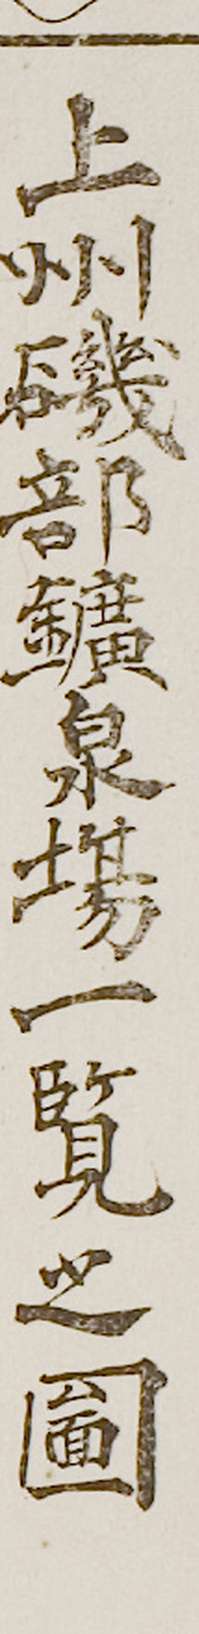上州磯部鉱泉場一覧之図
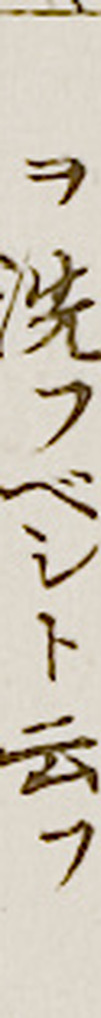ヲ洗フベシト云フ
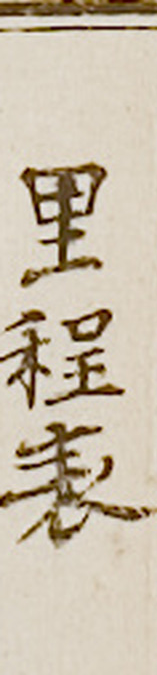里程表
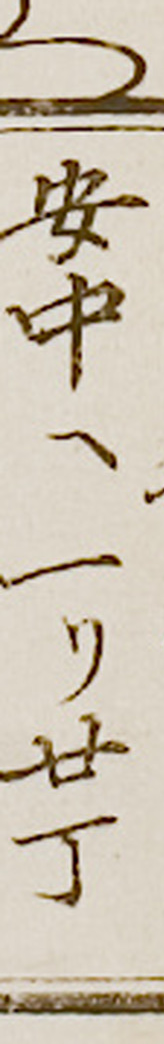安中ヘ一リ廿丁
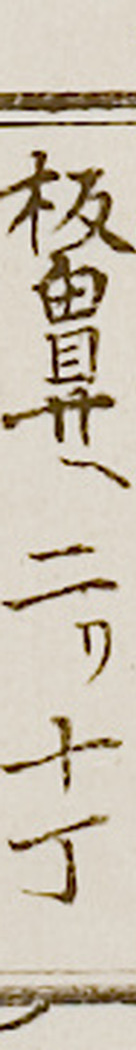板鼻ヘ二リ十丁
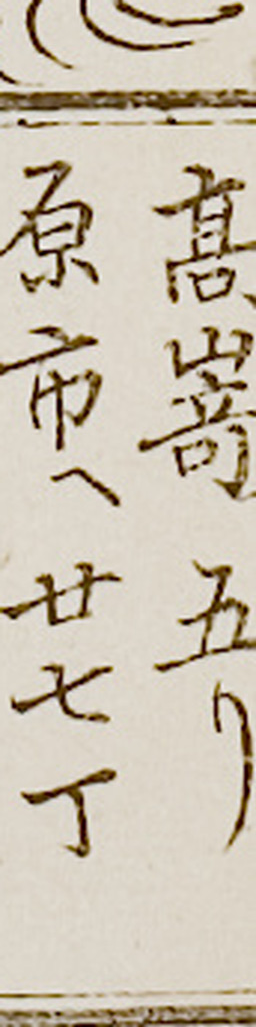原市ヘ廿七丁
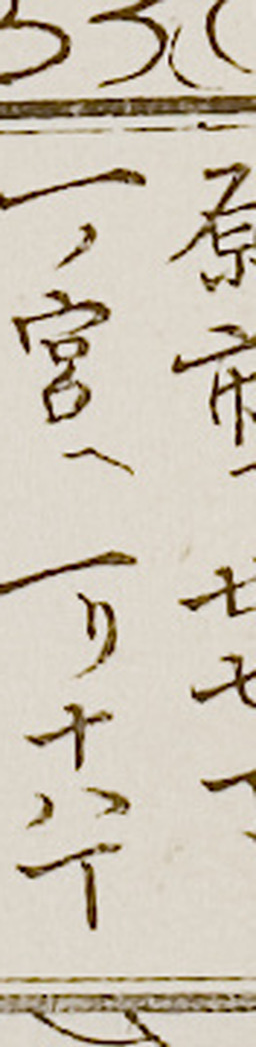一ノ宮ヘ一リ十八丁
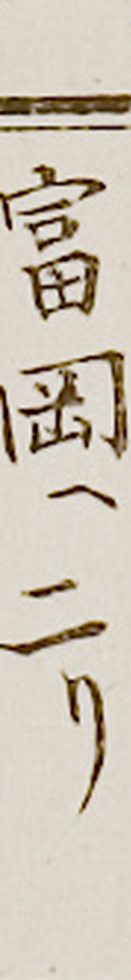富岡ヘ二リ
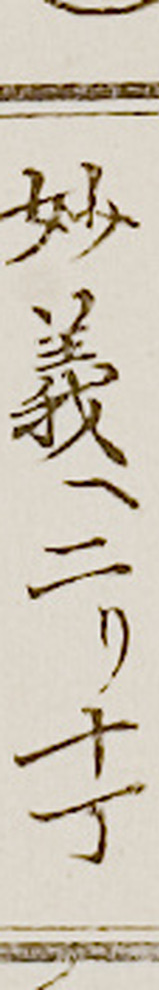妙義ヘ二リ十丁
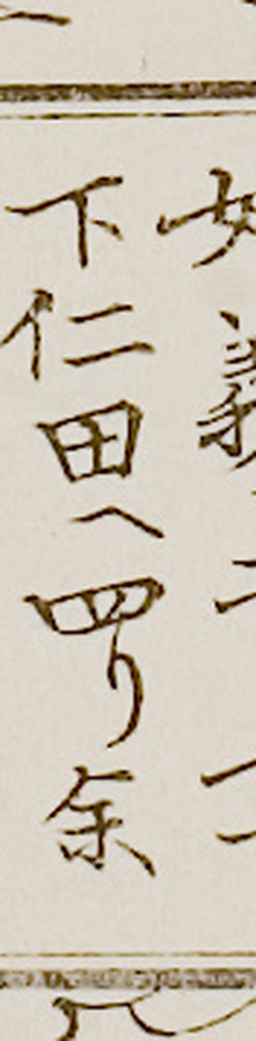下仁田ヘ四リ余
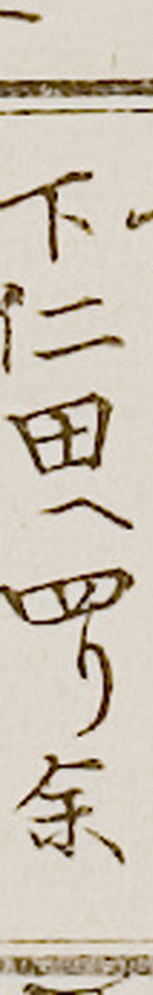下仁田ヘ四リ余
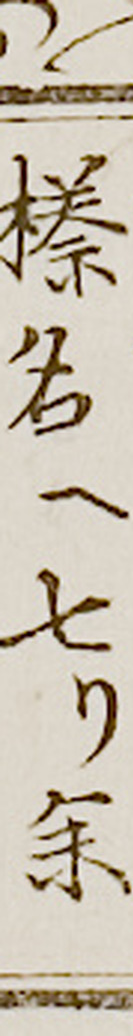榛名ヘ七リ余
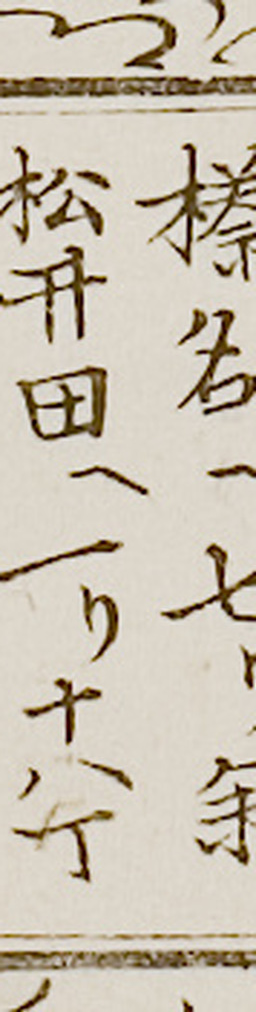松井田ヘ一リ十八丁
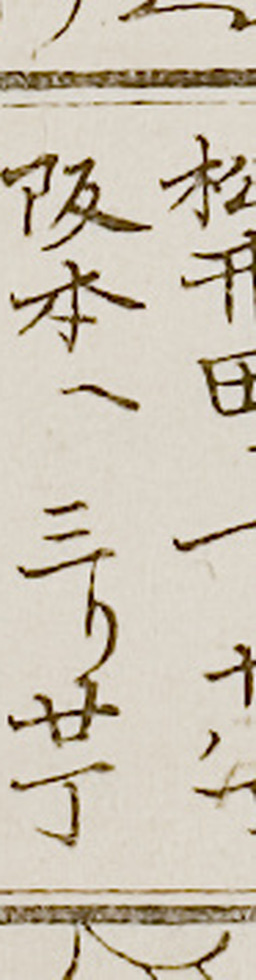阪本へ三リ廿丁
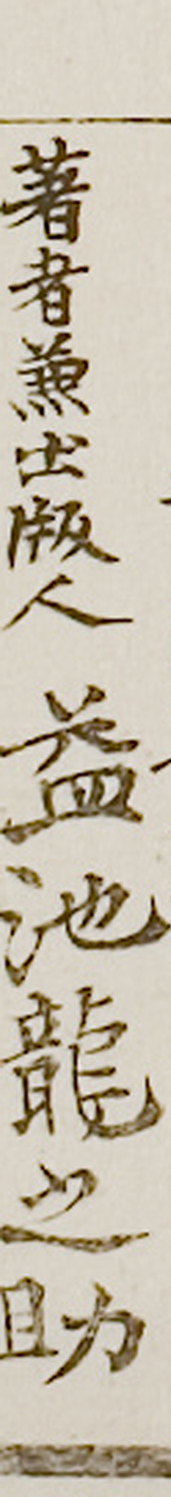著者兼出版人益池龍之助
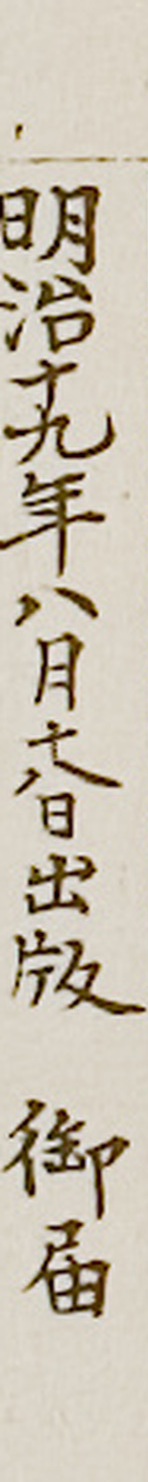明治十九年八月十八日出版御届
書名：上州磯部鉱泉場一覧之図
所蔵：東京大学総合図書館 General Library in the University of Tokyo, JAPAN
